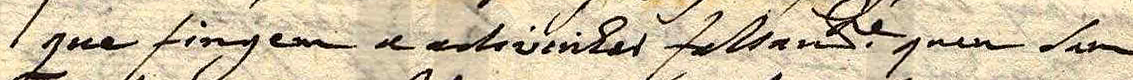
que fingem a adivinhar falsamt.e quem sam
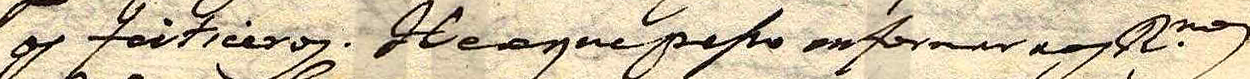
os feiticeiros. He o que pesso informar aos R.mos
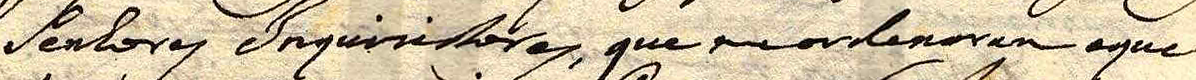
Senhores Inquizidores, que me ordenaram o que
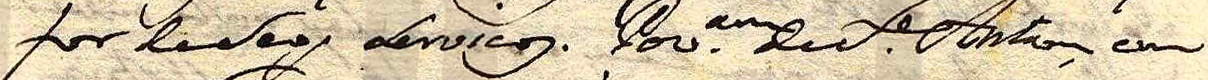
for de Seos servicos. Pov.am de S.to Antam, em
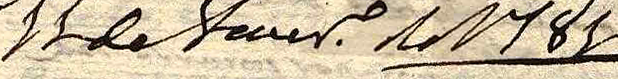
11 de Fever.o de 1781
